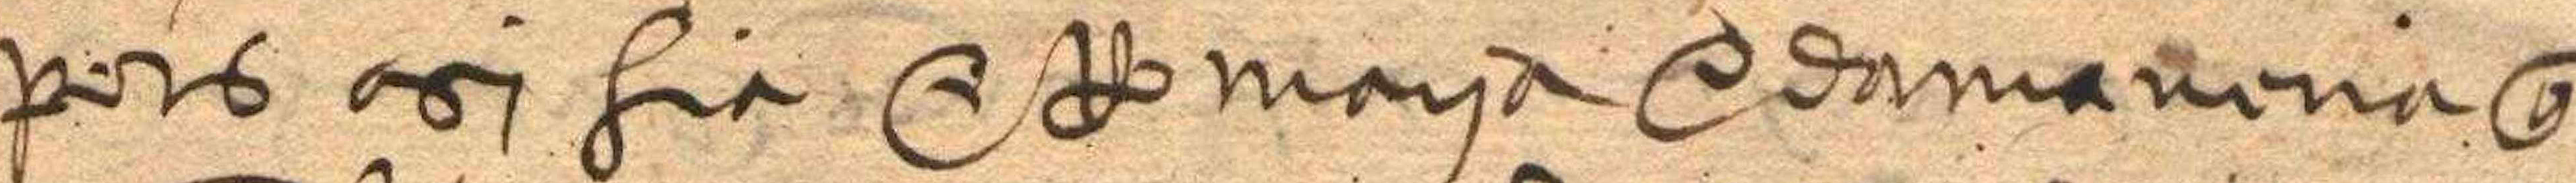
pois asj hia ē Romarja e da maneira q̄
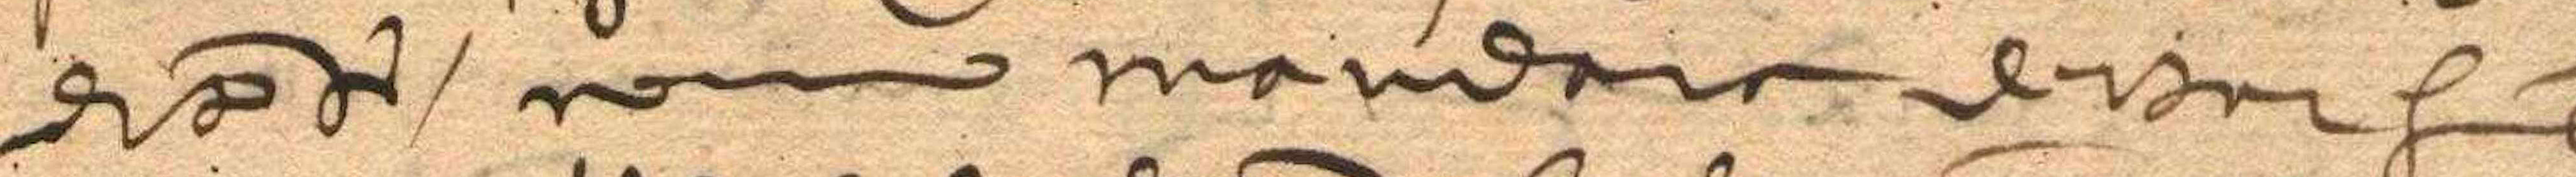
dito tē / como mandara deitar hūs
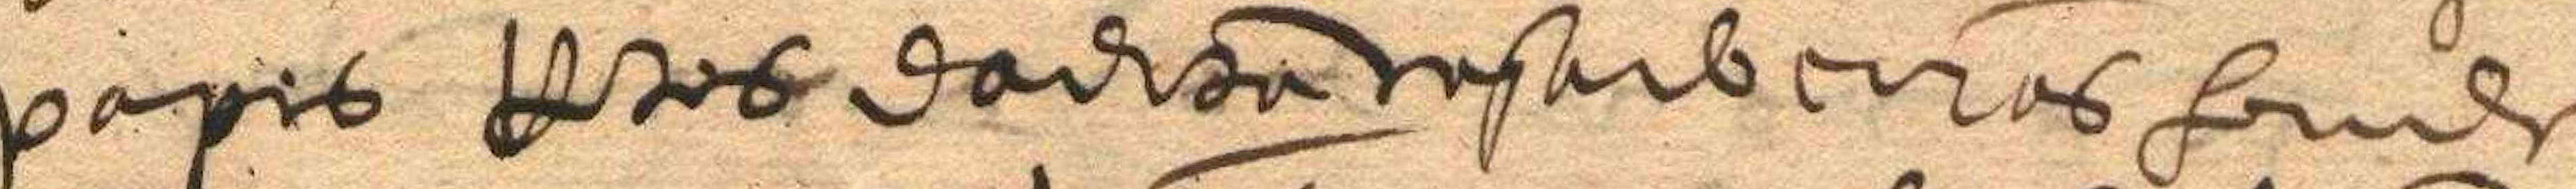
papes Rotos da dita casa doeiras honde
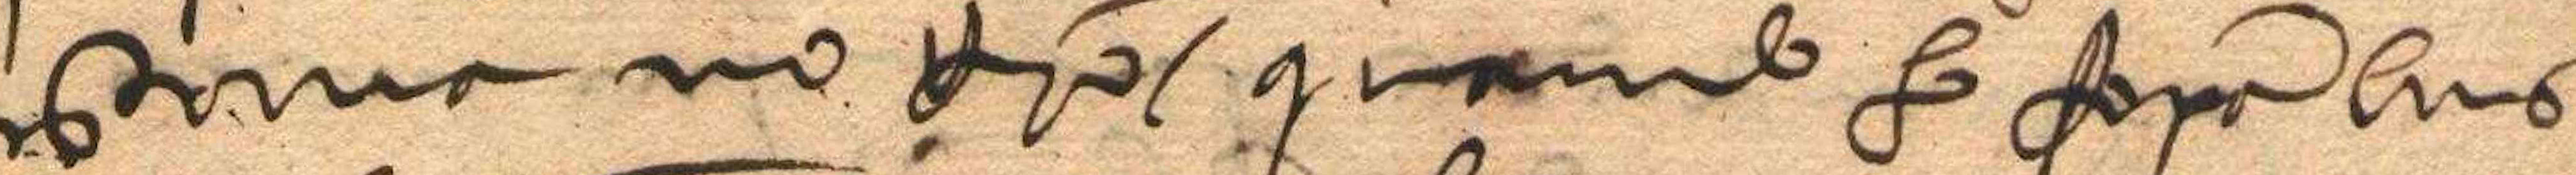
estaua no Rjo/ quando ho forā bus
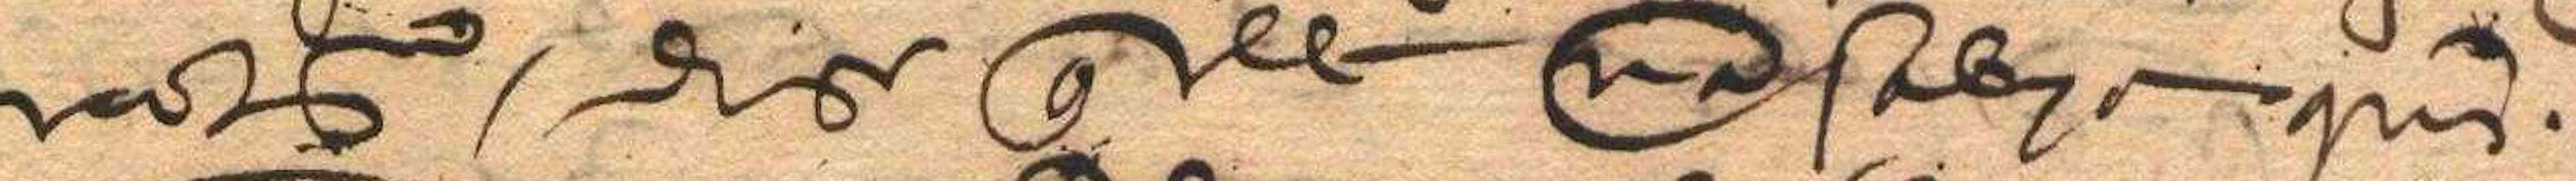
notro / dise q̄ elle n̄a sabya quē.
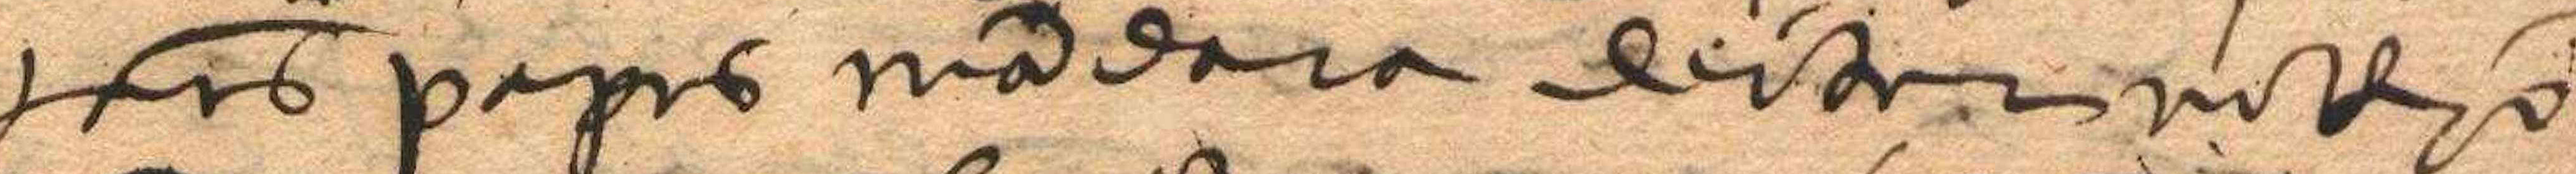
taēs papes mādara deitar no Rjo
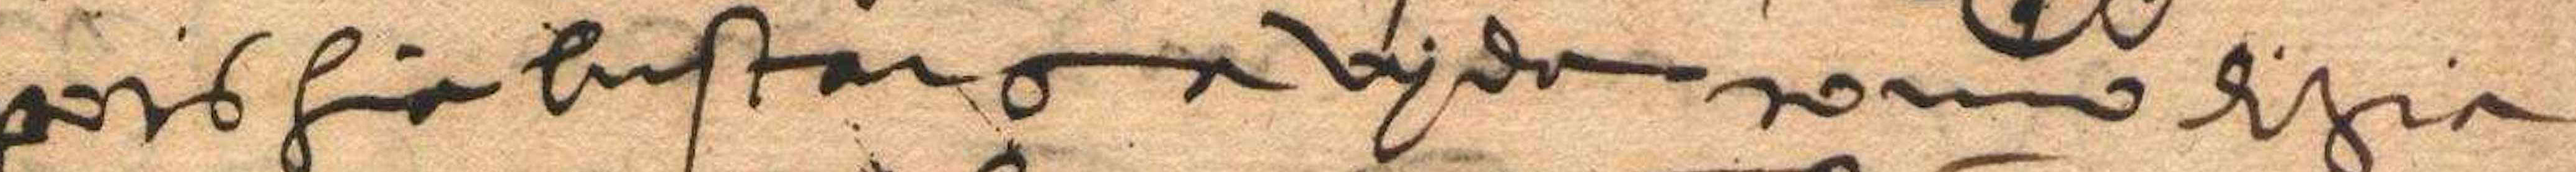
pois hia buscar sa vyda como dizia
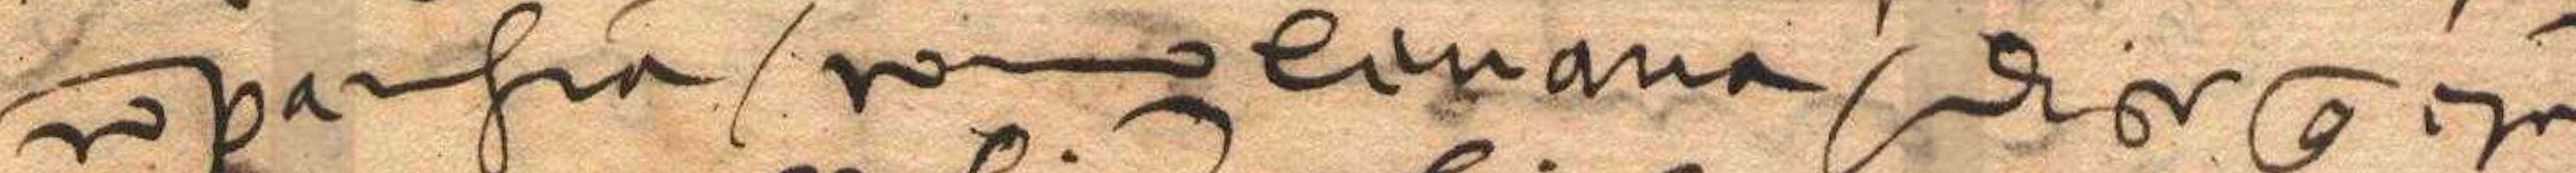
c̄opanhia / como leuaua / dise q̄ erā
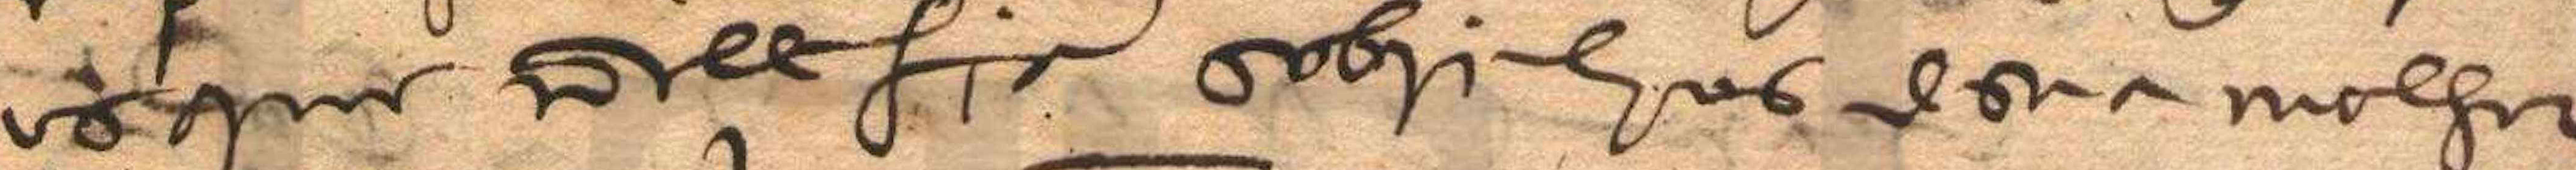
os que c̄o elle hjā sobrinhos de sua molher
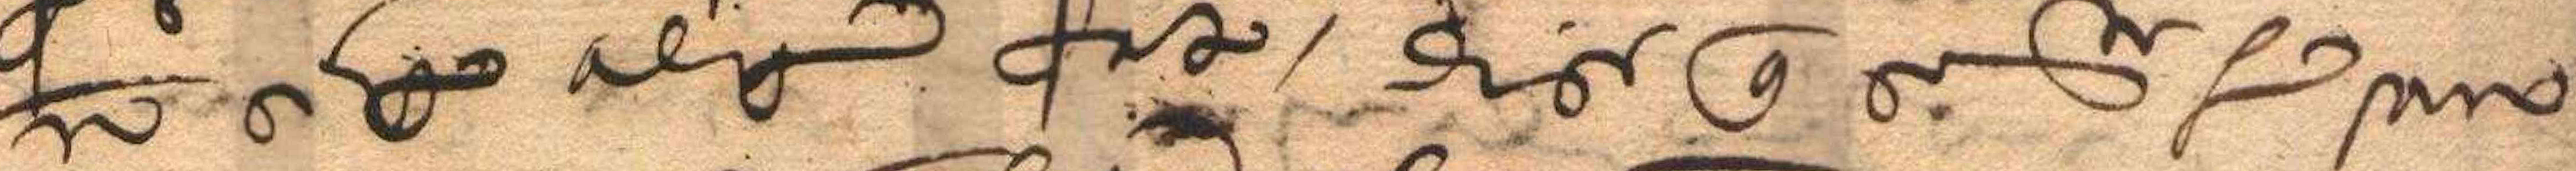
c̄osigo algū fato / dise q̄ somte hū saco
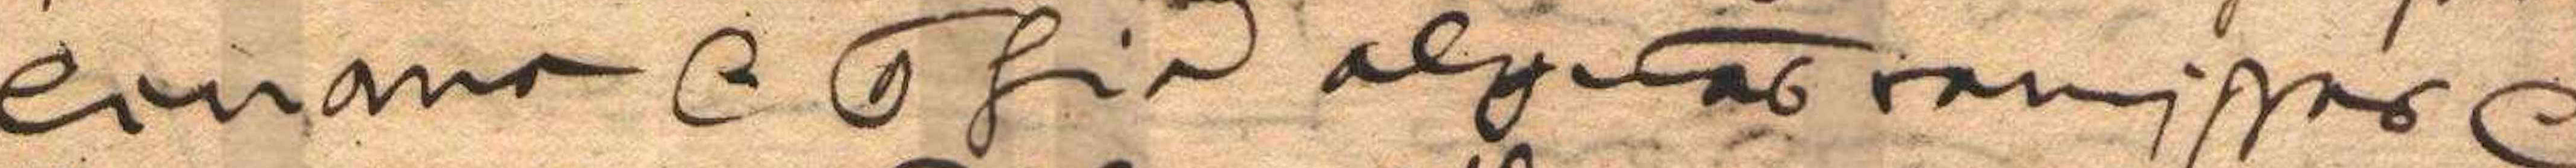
leuaua ē q̄ hiā alguās camjssas e
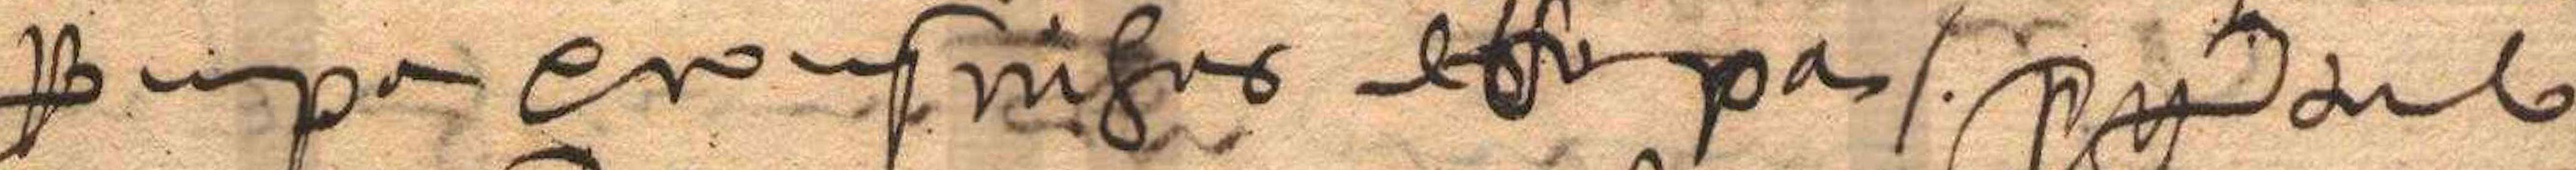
Roupa e cousinhas de Roupa /. p̄gūtado
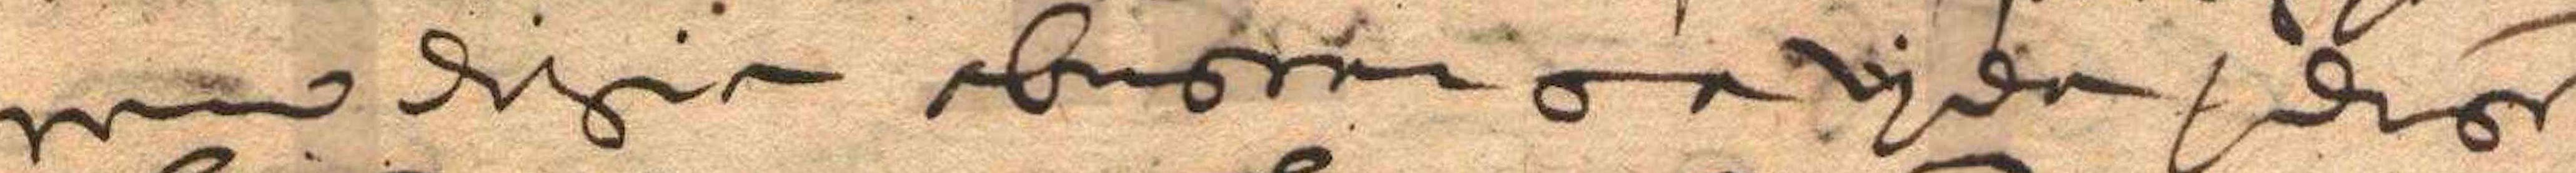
como dizia a buscar sa vyda / dise
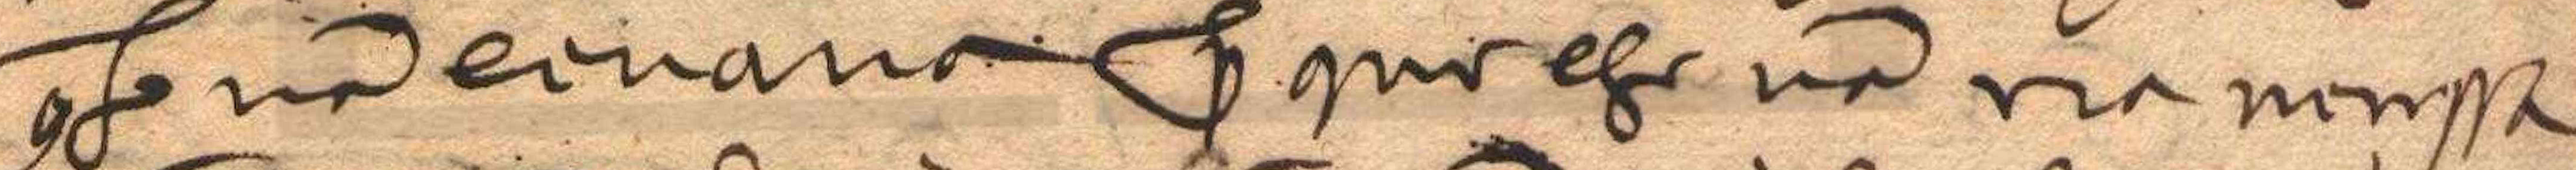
q̄ ho nā leuaua p̄oque lhe nā era neçessa
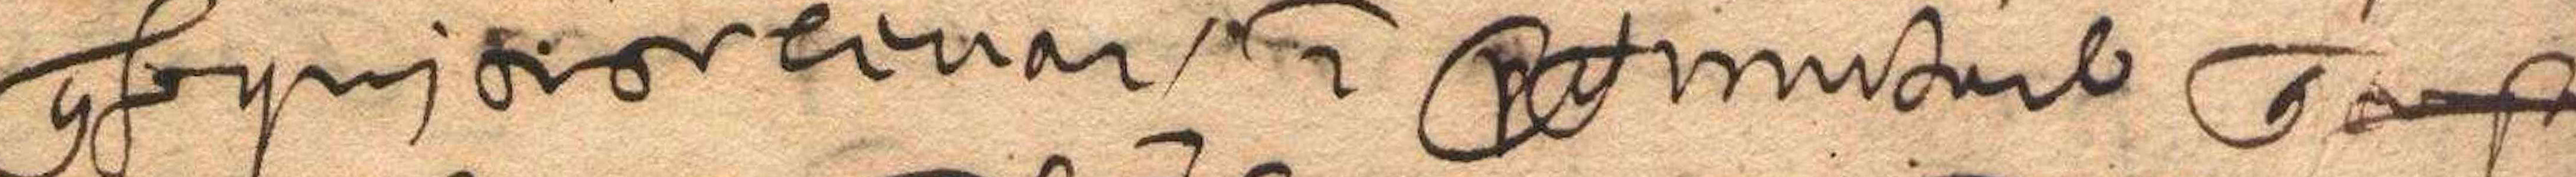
q̄ ho qujsese leuar / item p̄gumtado q̄ cousa
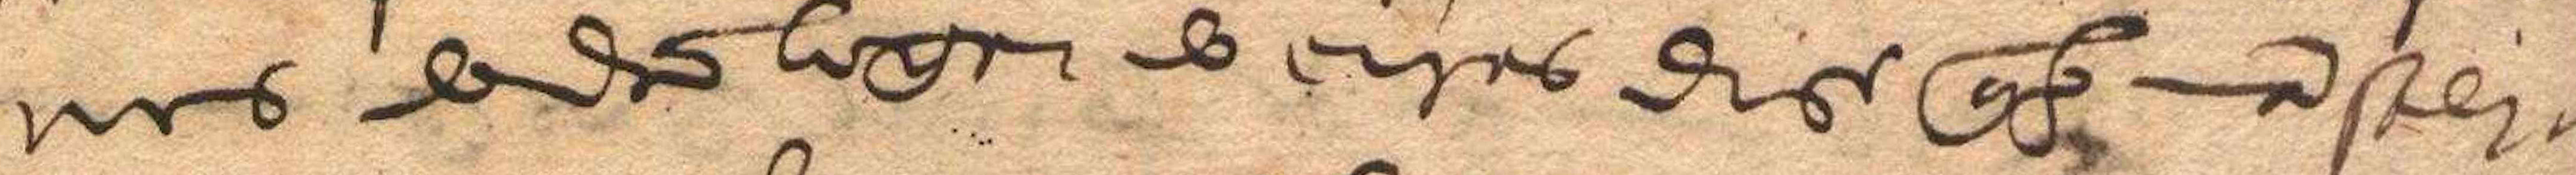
ues do dt̄o logar doeiras dise q̄ ho nā sabja
